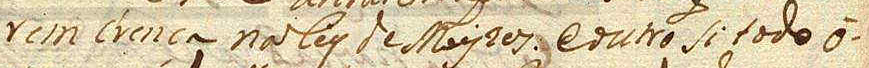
rem crença na ley de Moyzes, e outrosi todo o
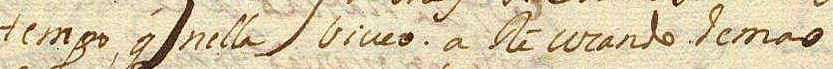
tempo q̄ nella viueo. a Re uzando de mao
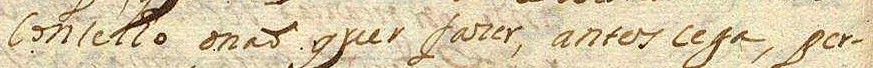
Conselho o naõ quer fazer, antes cega, per
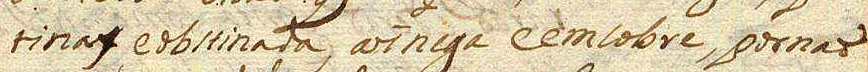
tinax, e obstinada, as nega e emcobre, por naõ
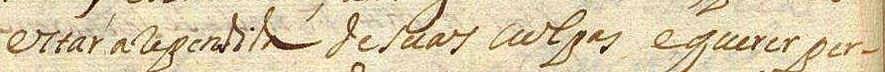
estar aRependida de suas culpas e querer per
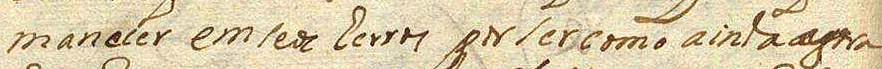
manecer em seos herros por ser como ainda agora
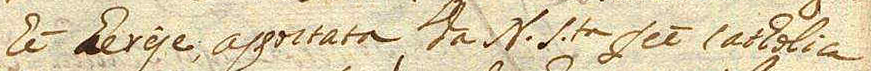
hé hereje, apostata da N. s.ta feé catholica
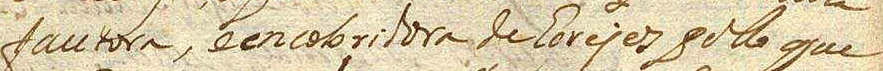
fautora, e encobridora de herejes pello que
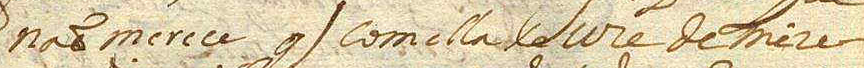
naõ merece q̄ com ella se uze de mize
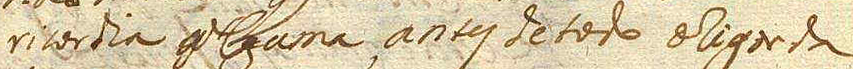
ricordia alguma, antes de todo o Rigor da
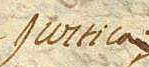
justiça
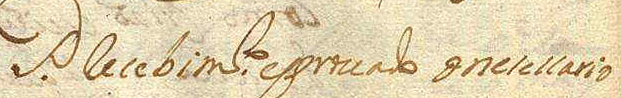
P. Recebim.to e prouado o necessario
